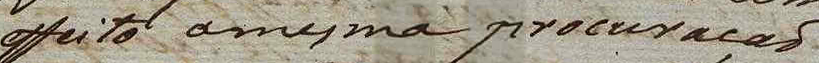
effeito a mesma procuraçaõ
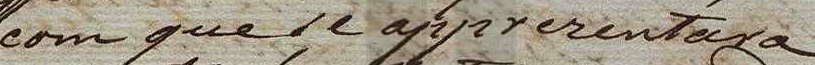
com que se apprezentara
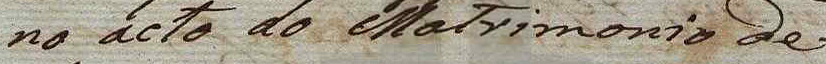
no acto do Matrimonio de
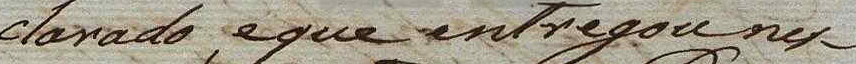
clarado, e que entregou nes
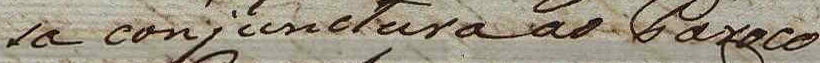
sa conjunctura ao Paroco
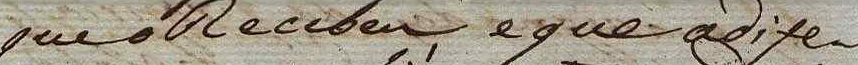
que o Recebeu e que a dife
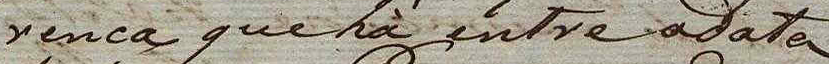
rença que hà entre a data
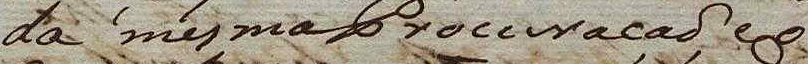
da mesma Procuração e o
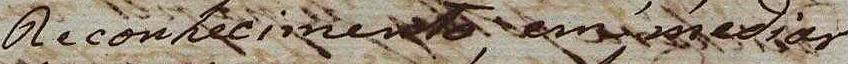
Reconhecimento; em mediar
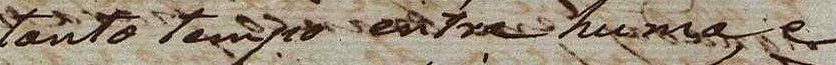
tanto tempo entre huma, e
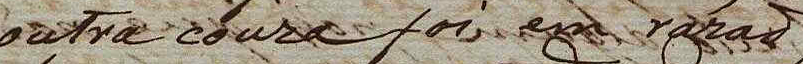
outra couza foi em razaõ
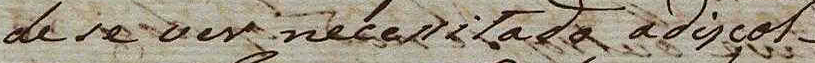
de se ver necessitado a disçol
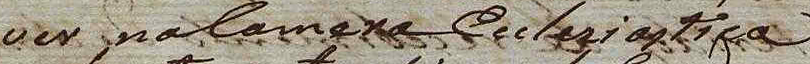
ver na Camera Eccleziastica
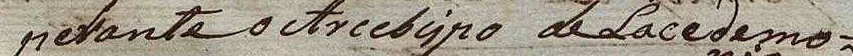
perante o Arcebispo de Lacedemo
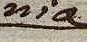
nia
